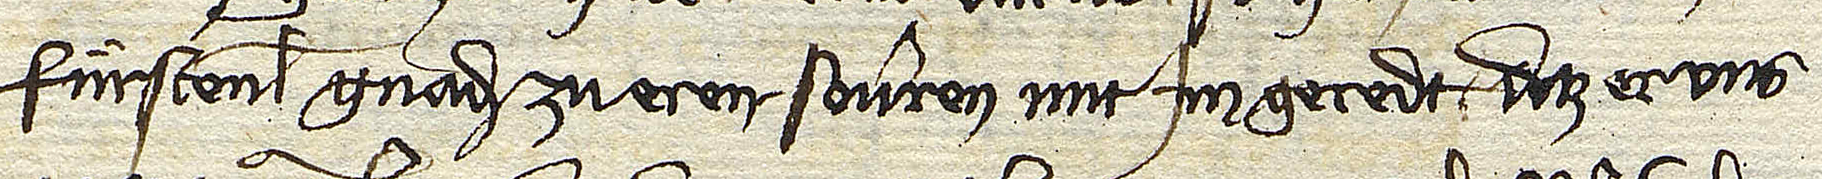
fürſtenl* gnad* ʒu eren ſou*ren mit Im geredt / daʒ er vns
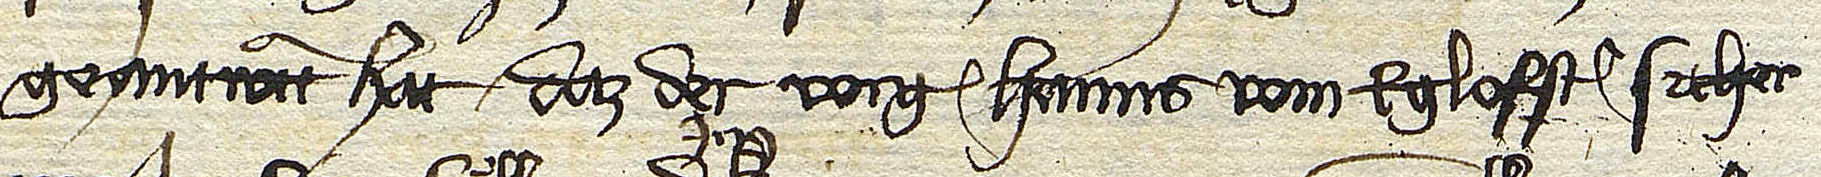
geantw*tt hat / daʒ der vorg* hanns von Eglofſt* ſicher
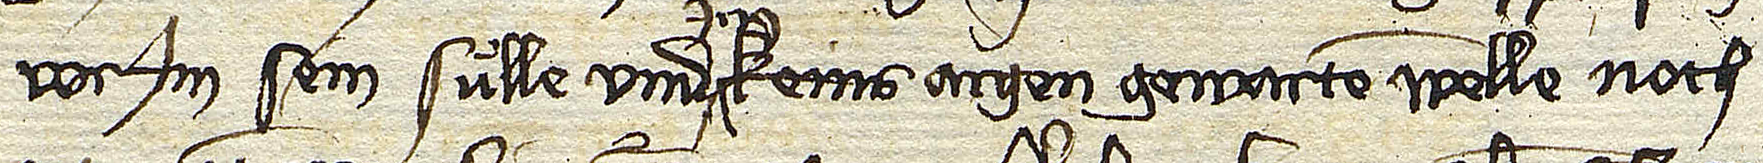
vor Im ſein ſülle vnd keins argen gewarte* welle noch
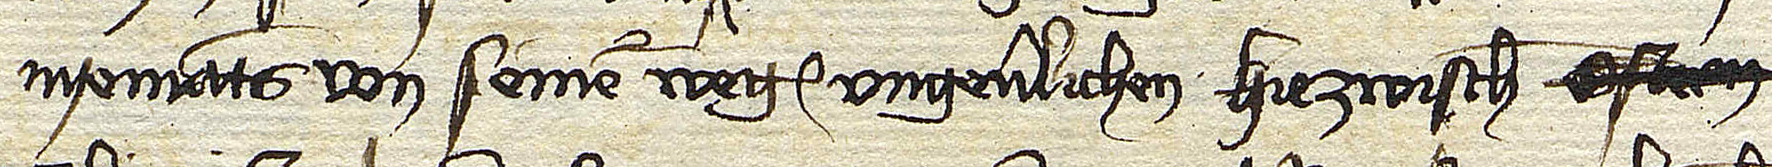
nyema*ts von ſeine* weg* vngeu*lichen . hieʒwiſch* Oſtern
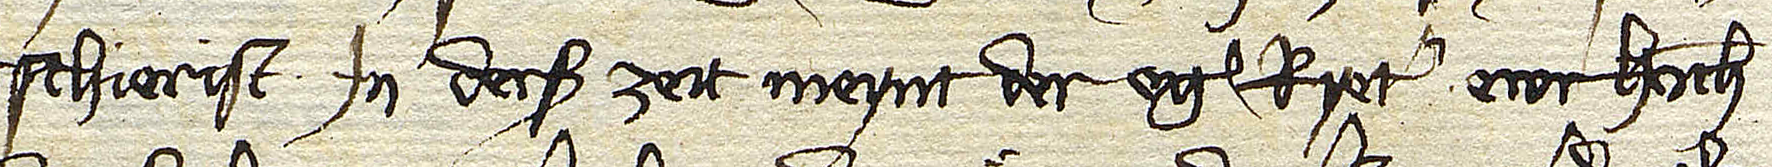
ſchieriſt . In derſ* ʒeit meynt der eg* Ryet* . ewr hoch*
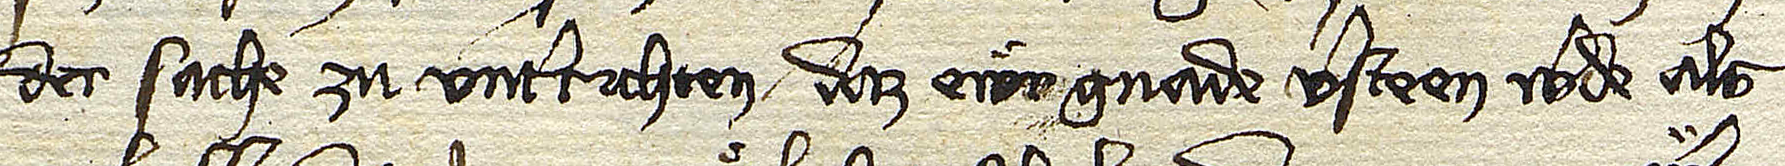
der ſache ʒu vnt*richten / daʒ ewr gnade v*ſteen w*de als
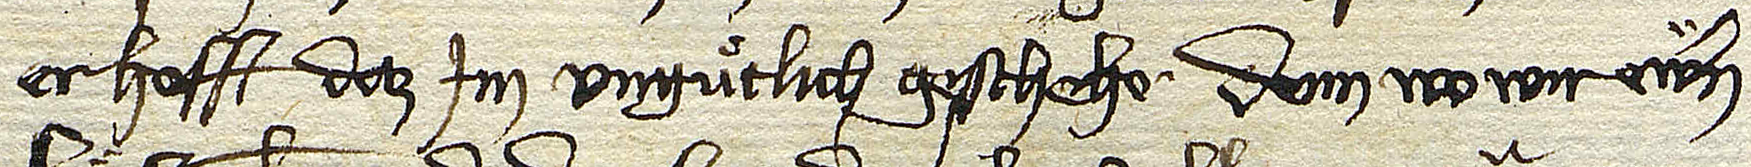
er hofft daʒ Im vngütlich geſchehe . Denn wo wir ew*n
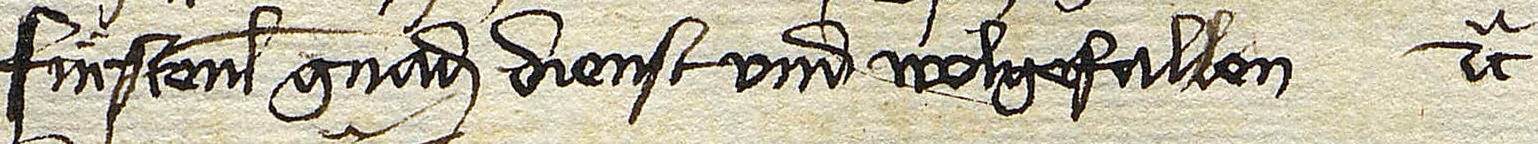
fürſtenl* gnad* dienſt vnd wolgefallen ec*
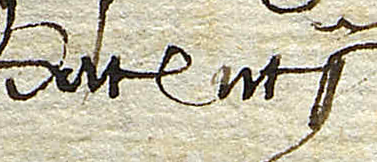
Dat* ut ſ*
